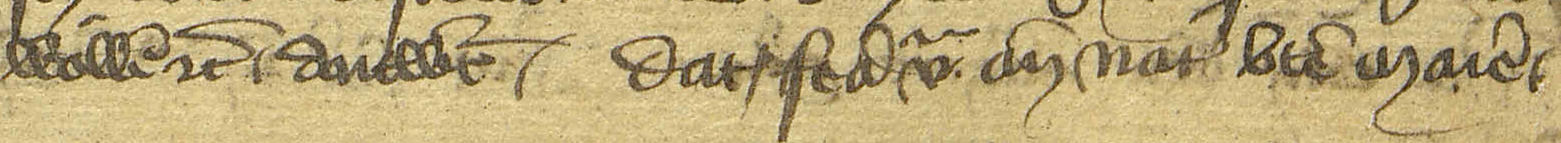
wölle* ec* / Antw*t / Dat* fea* v* an* nat* bte* Maie* /
